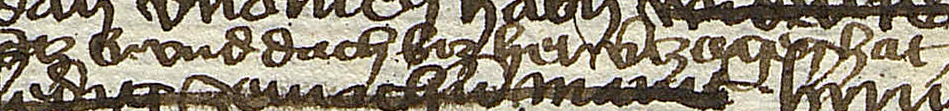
daʒ Er vnd doch biʒ her v*ʒogen hat
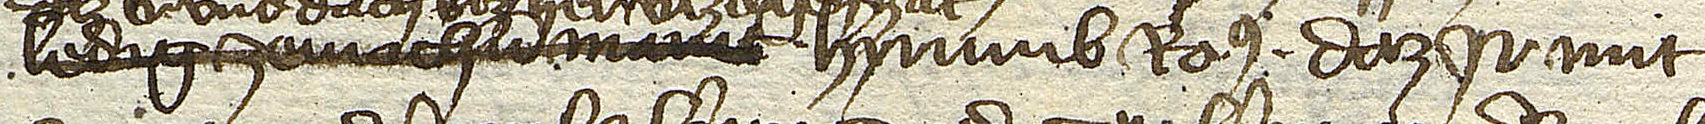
ledig cʒemach*n maint Hyrumb Ro* . daʒ Ir mit
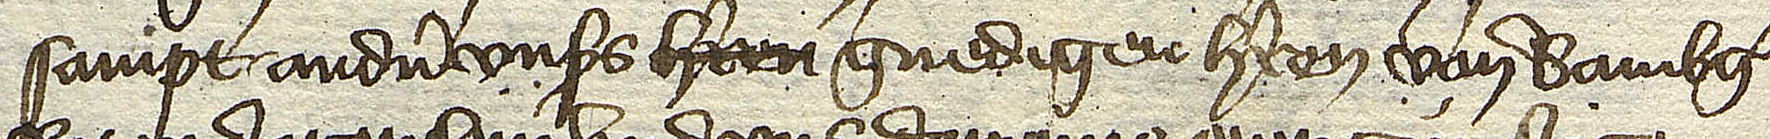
ſampt / and*n vnſ*s h*ren gnedigen h*ren von Bamb*g
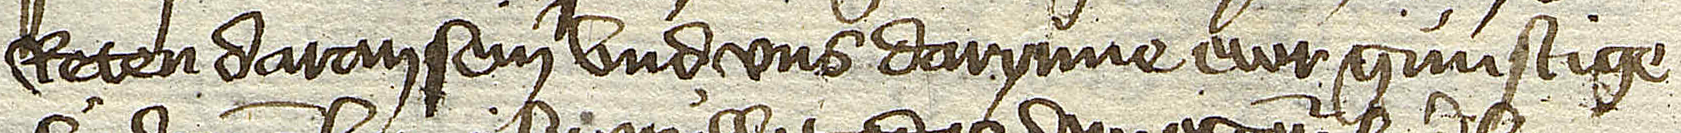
Reten daran ſein vnd vns darynne ewr günſtige
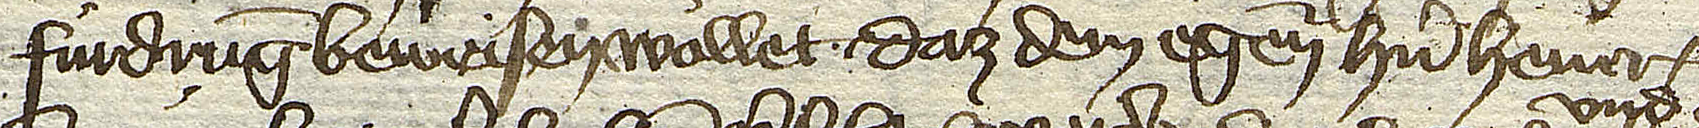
fürdru*g beweiſen wöllet . / daʒ dem egen* h*n heinr*
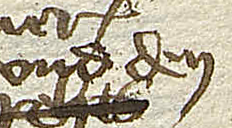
vnd den
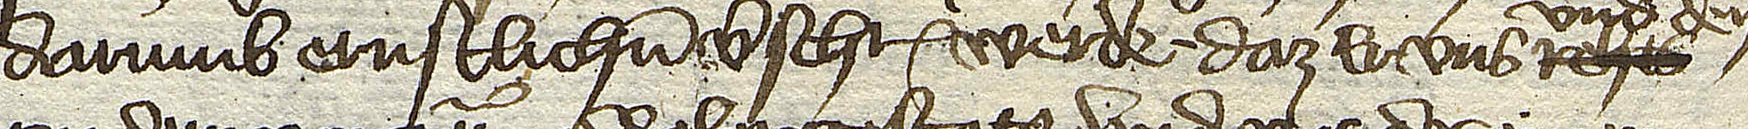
darümb ernſtlich*n v*ſchr* werde . daʒ Er vns rehts
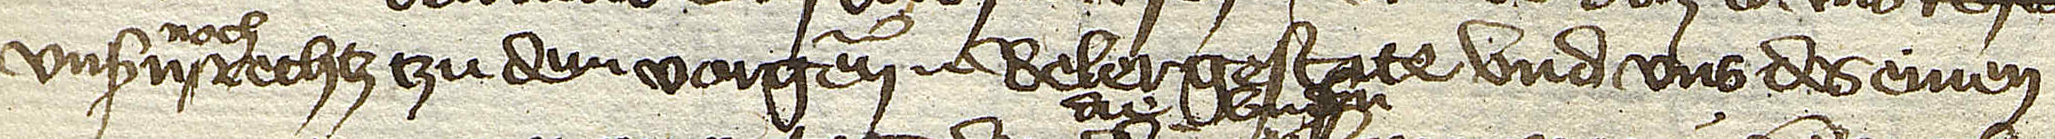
vnſ*n rechcʒ cʒu dem vorgen* ~ Beler geſtate vnd vns des einen
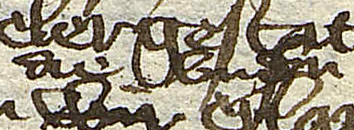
die vnſ*n
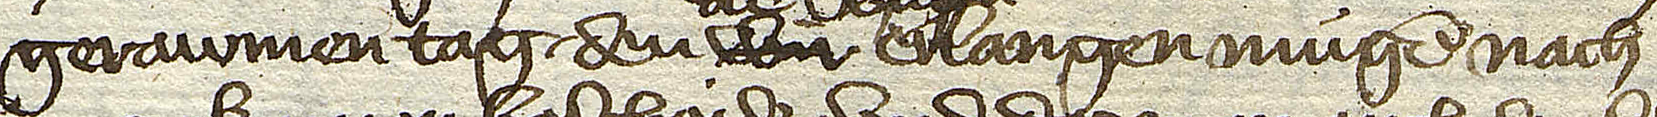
gerawmen tag / den wir erlangen müge* nach
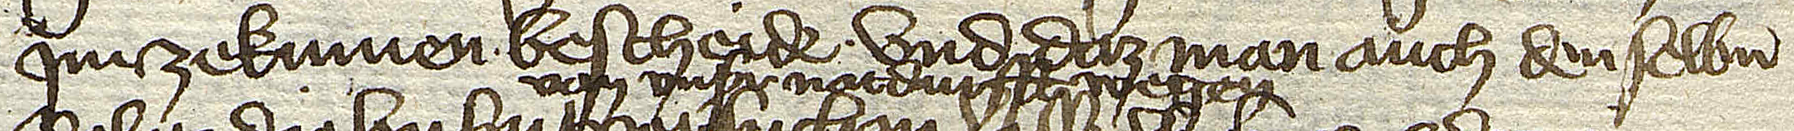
Im cʒekumen . beſcheide . vnd daʒ man auch denſelb*n
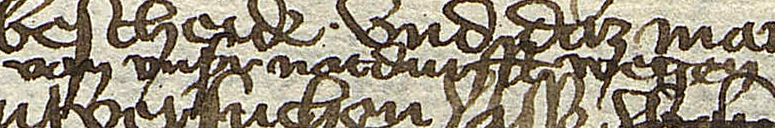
von vnſ*r notdurfft wegen
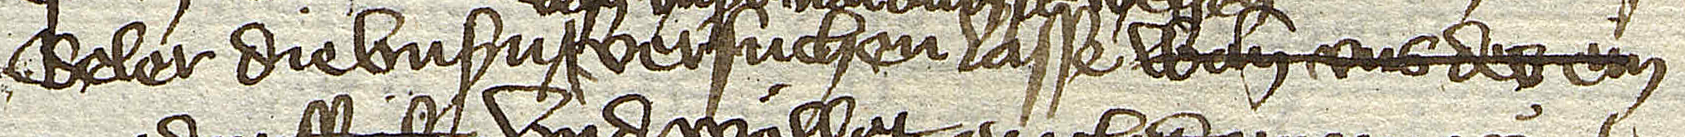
Beler die vnſ*n verſuchen laſſe Wan* vns des ein
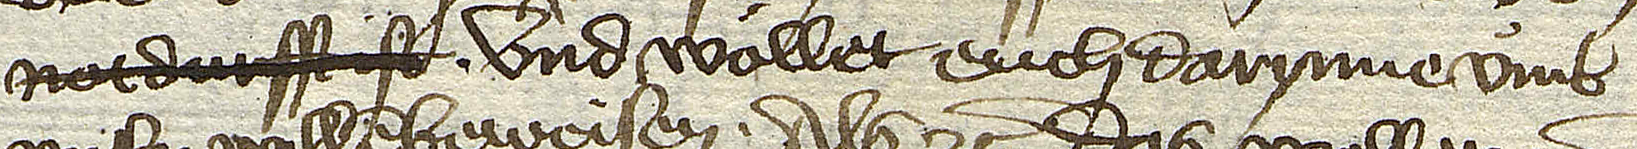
notdurfft iſt . Vnd wöllet euch darynne v̈mb
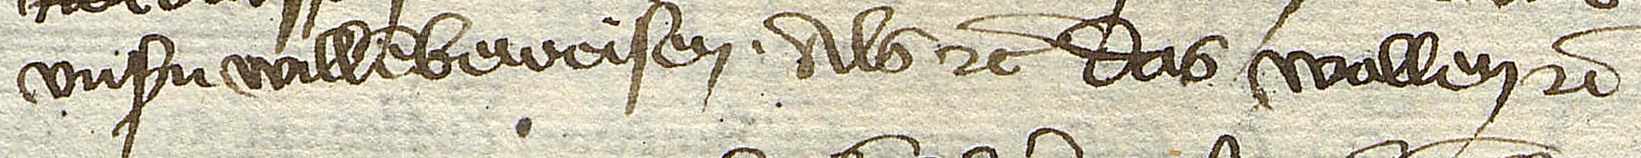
vnſ*n wille* beweiſen . Als ec* das wollen ec*
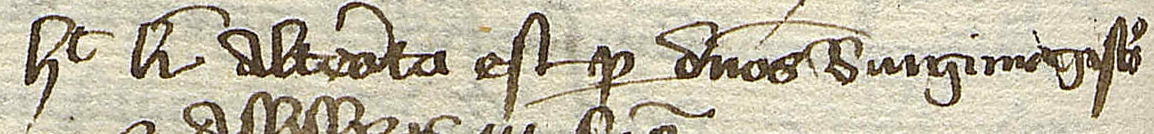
h* lr* Alteata* eſt p* dnos* Burgimagiſto*
